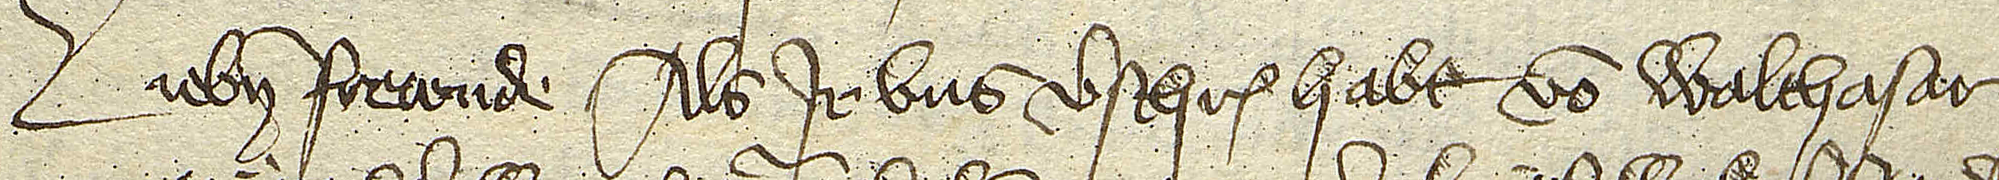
Liebn* frewnde / Als Ir vns v*ſchr* habt vo* Walthaſar
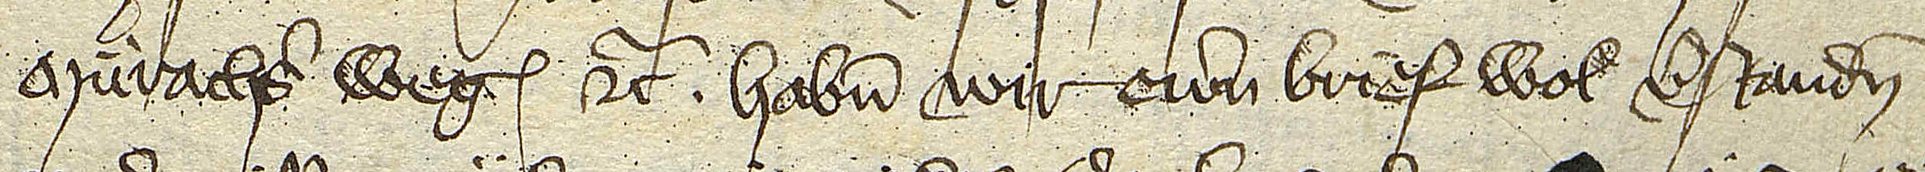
Mürachs* wege* ec*. habn* wir ew*n brief wol v*ſtandn*
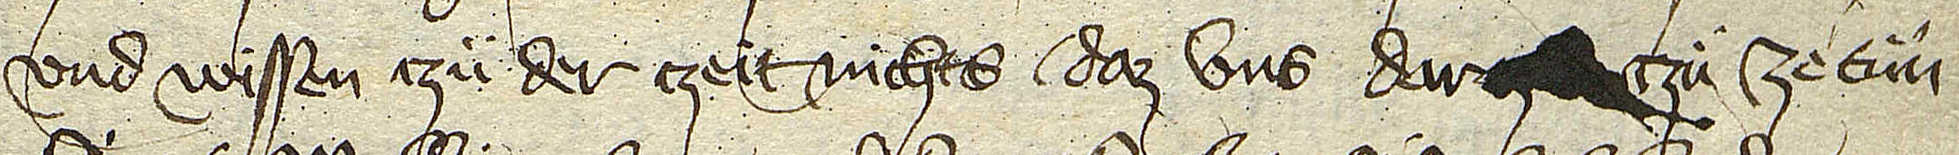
vnd wiſſen cʒü der cʒeit nichts / daʒ vns darcʒü cʒü cʒe tün
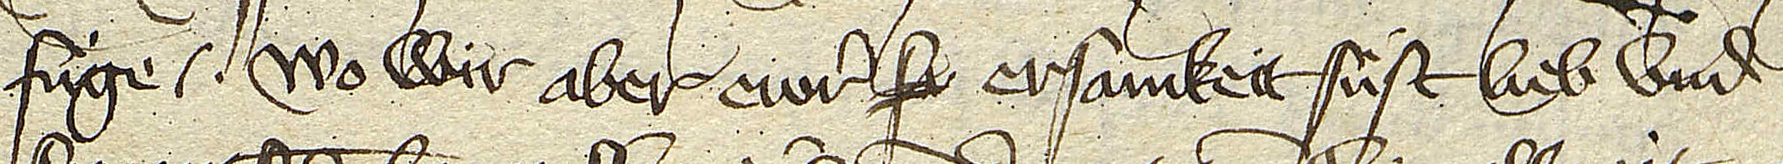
füge /. wo wir aber ewr* fr erſamkeit ſüſt lieb vnd
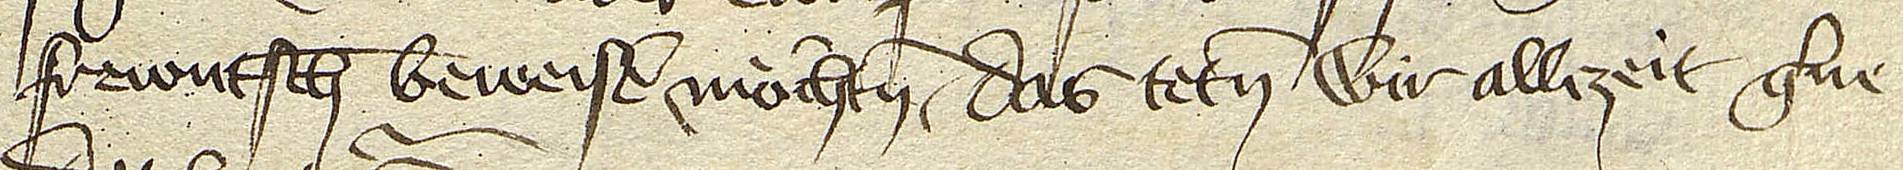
frewntſch beweiſe* möchtn* / das tetn* wir allcʒeit g*ne
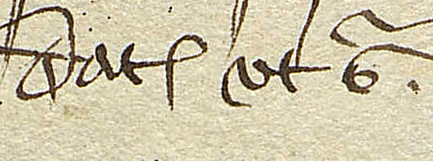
Dat* vt s* .
